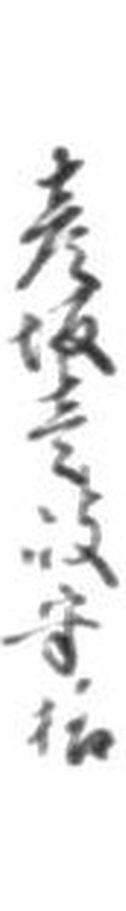彦坂壱岐守様
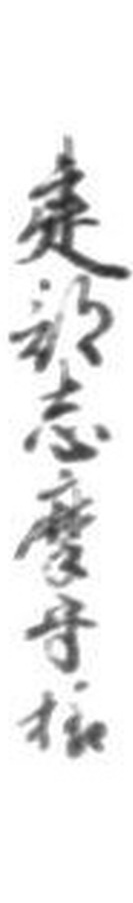建部志摩守様
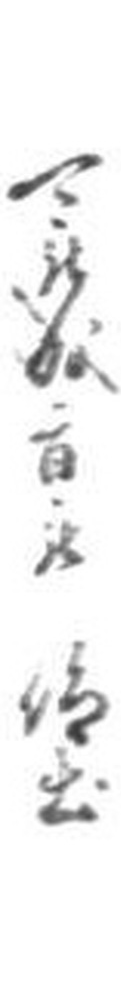可被成旨被仰出
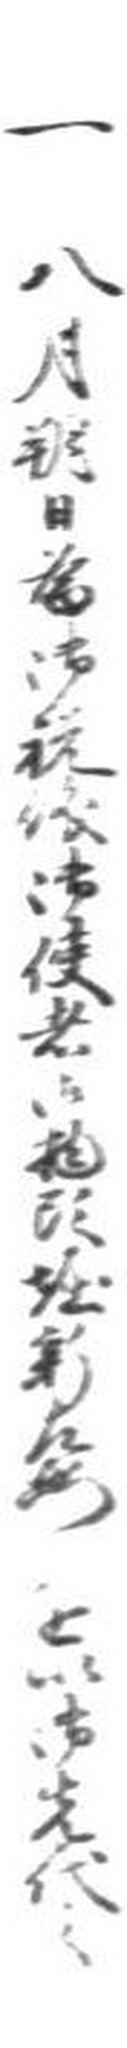一八月朔日為御祝儀御使者御物頭堀新左衛門を以御先代之

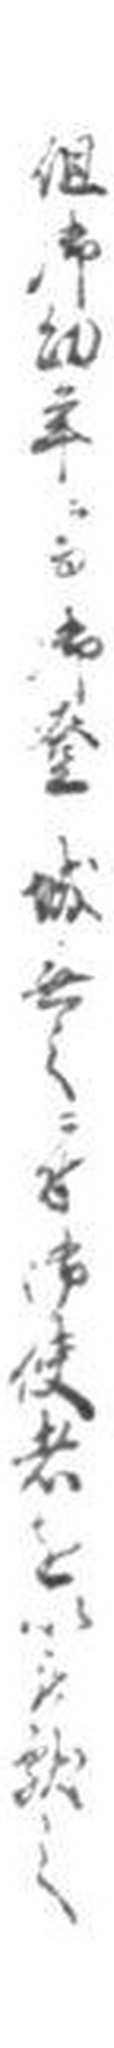但御幼年ニ而御登城無之ニ付御使者を以被献之
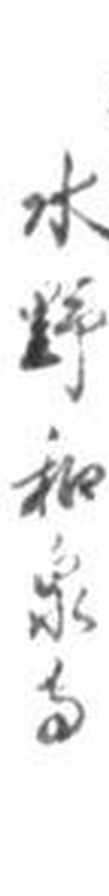水野和泉守
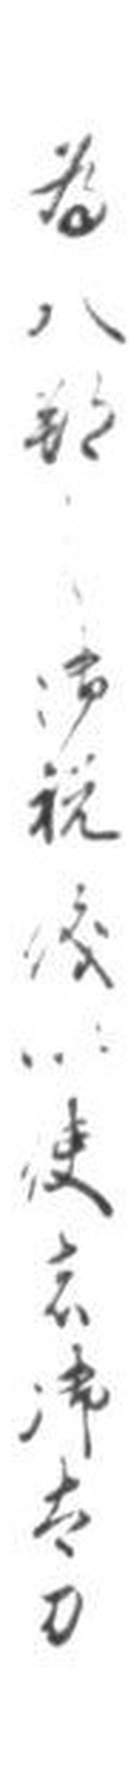為八朔之御祝儀以使者御太刀
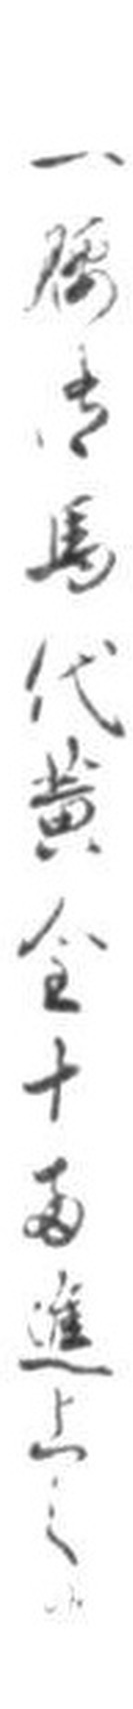一腰馬代黄金十両進上之候
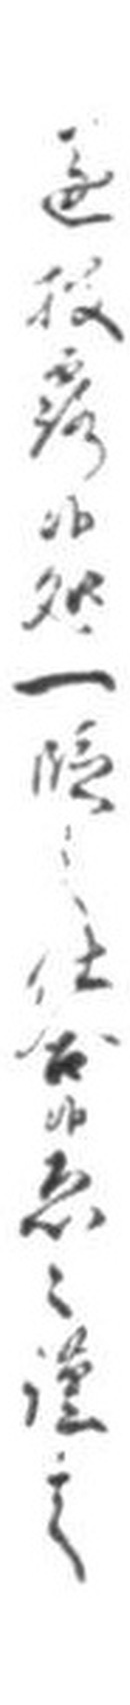遂披露候処一段之仕合候恐々謹言
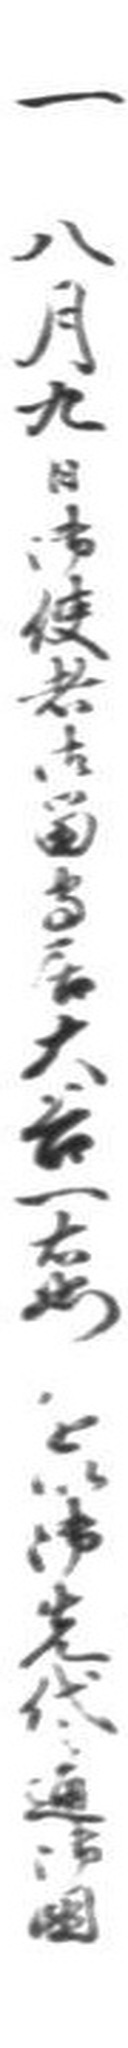一八月九日御使者御留守居大谷一右衛門を以御先代之通御国
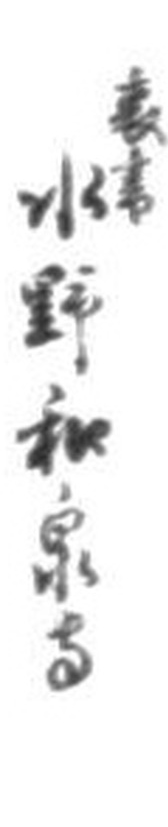水野和泉守
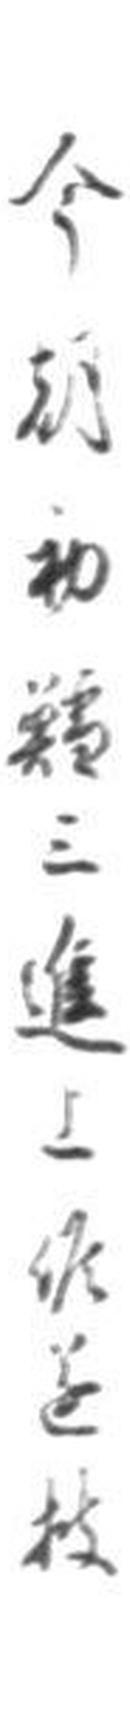今朝初鯖三進上候遂披
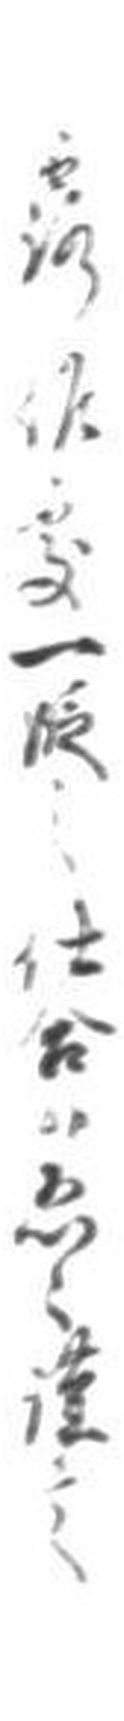露候処一段之仕合候恐々謹言

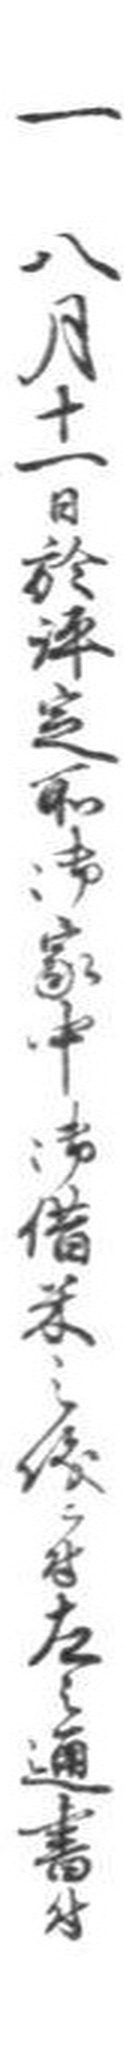一八月十一日於評定所御家中御借米之儀ニ付左之通書付
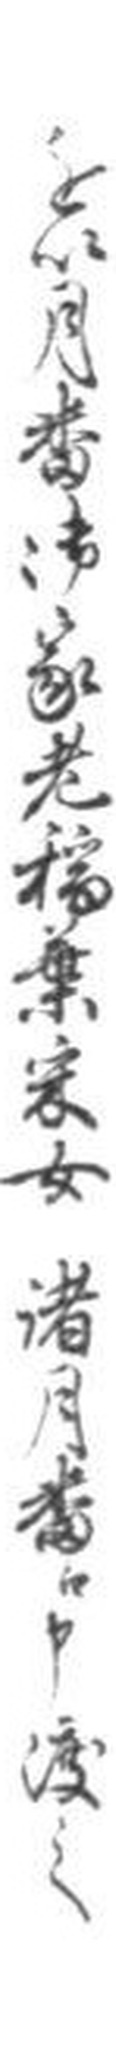を以月番御家老稲葉采女諸月番江申渡之
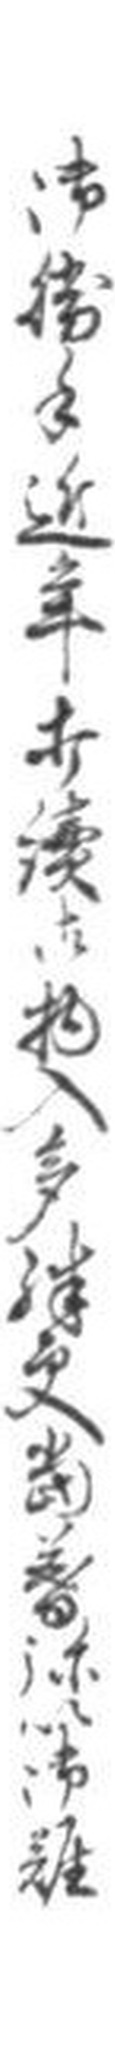御勝手近年打続御物入多殊更当暮弥以御難
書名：家譜 三十八 宗矩公 従享保九年五月到享保九年十二月
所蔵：福井県文書館 Fukui Prefectural Archives
